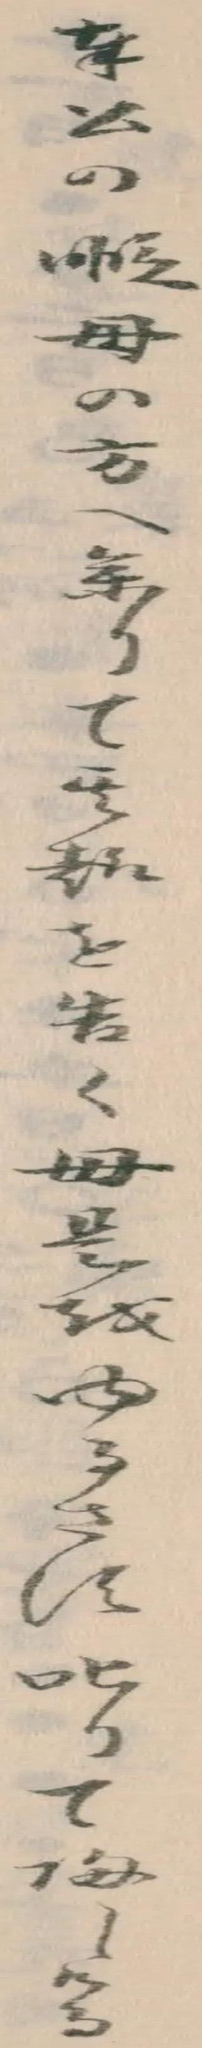奉公の暇母の方へ参りて其趣を告く母是をゆるさす叱りて帰しける
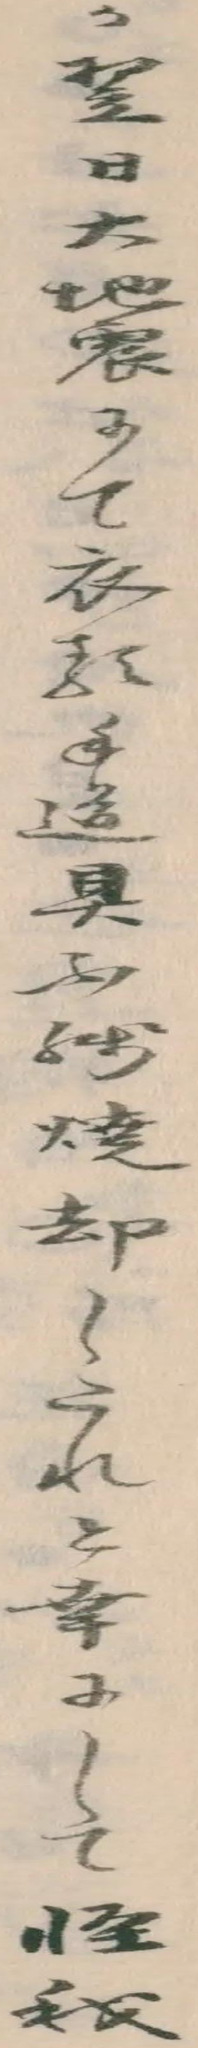か翌日大地震にて衣類手道具不残焼却したれと幸にして怪我
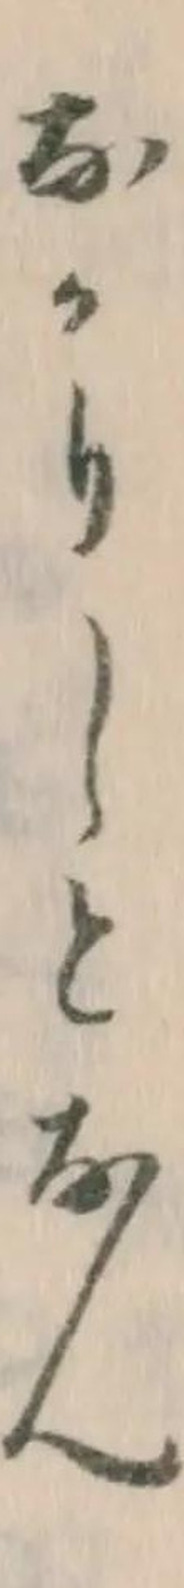なかりしとなん
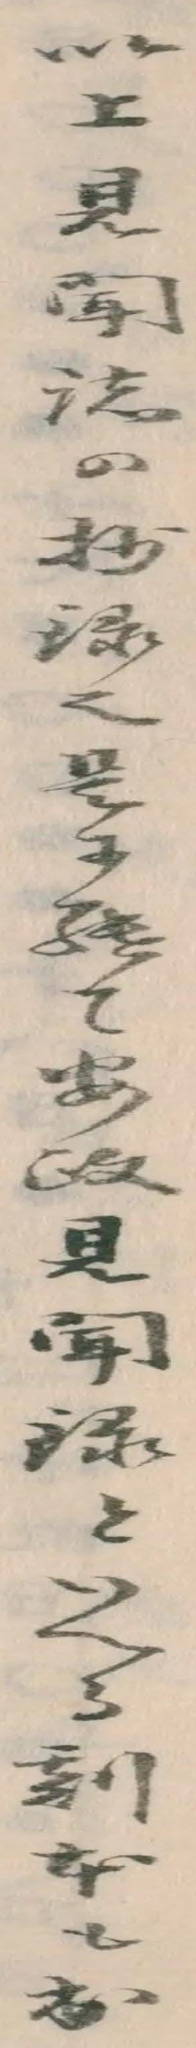以上見聞誌の抄録也是に繾て安政見聞録といへる刻本も出
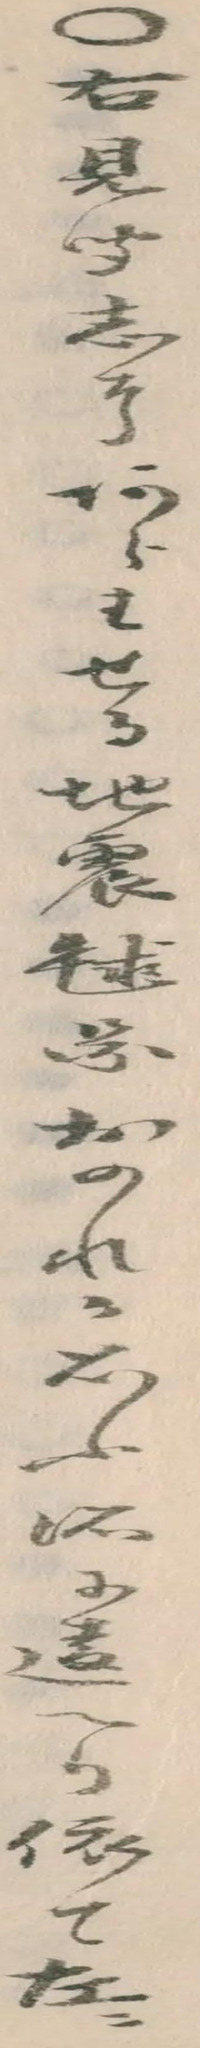〇右見聞志にあらはせる地震毬図おのれか思ふ跡に違へり依て左

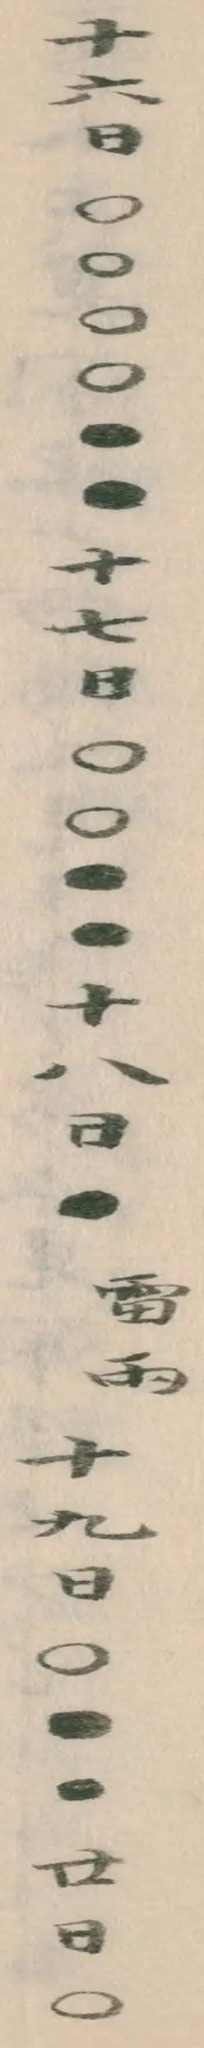十六日〇〇〇〇●●十七日〇〇●●十八日●雷雨十九日〇●●廿日〇
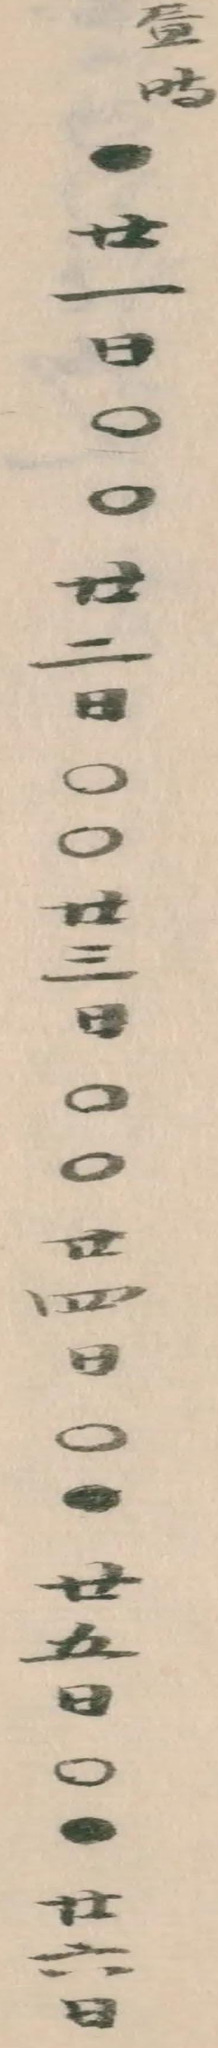昼時●二十一日〇〇廿二日〇〇廿三日〇〇廿四日〇●廿五日〇●廿六日
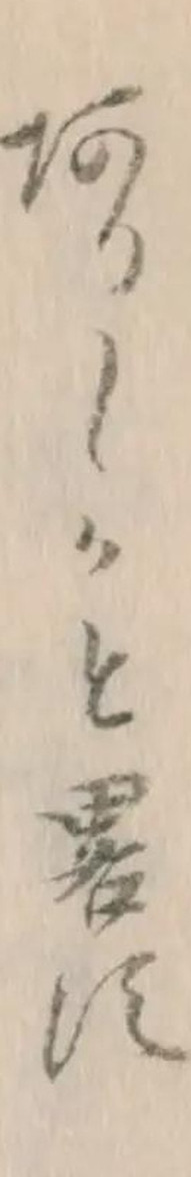ありしかと略す

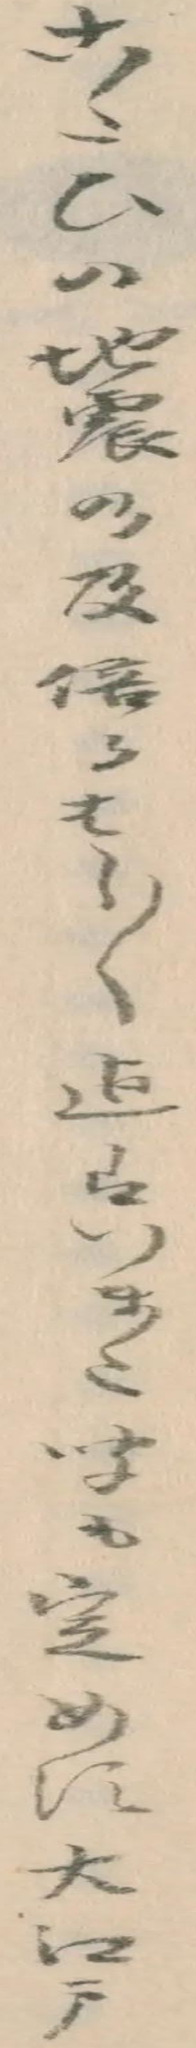こたひの地震の及へるはし〳〵迄はいまた聞も定めす大江戸
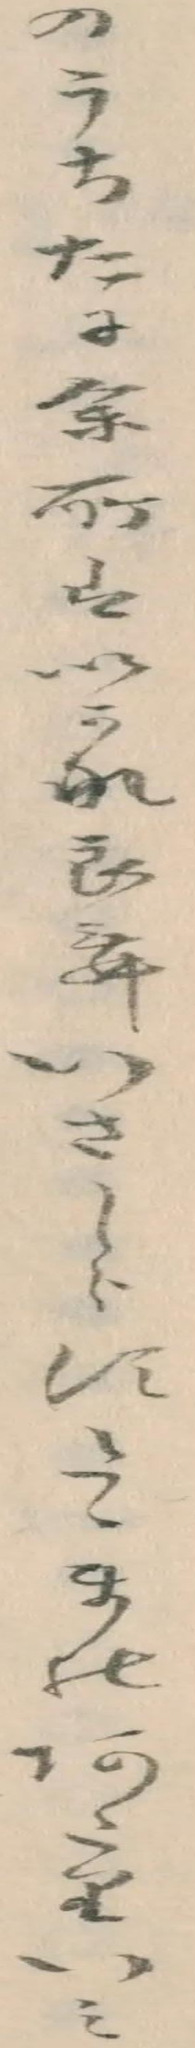のうちたに余所はいかならむいさしらすたゝまのあたりいみ
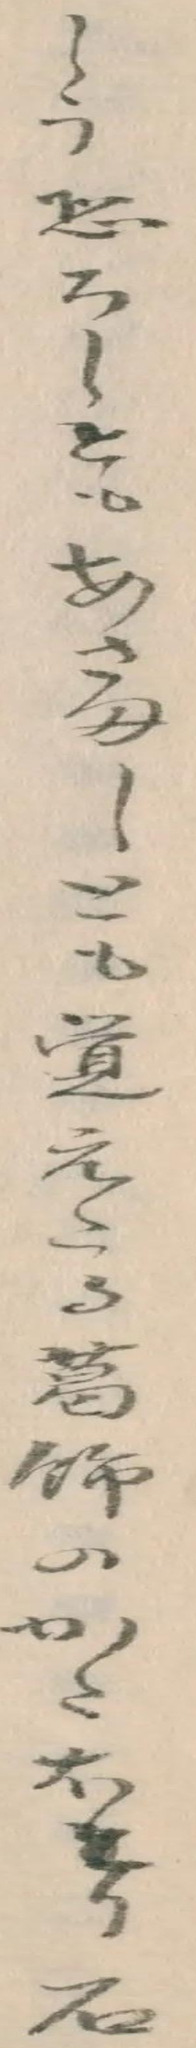しう恐ろしともあさましとも覚えたる葛飾のかたほとり石
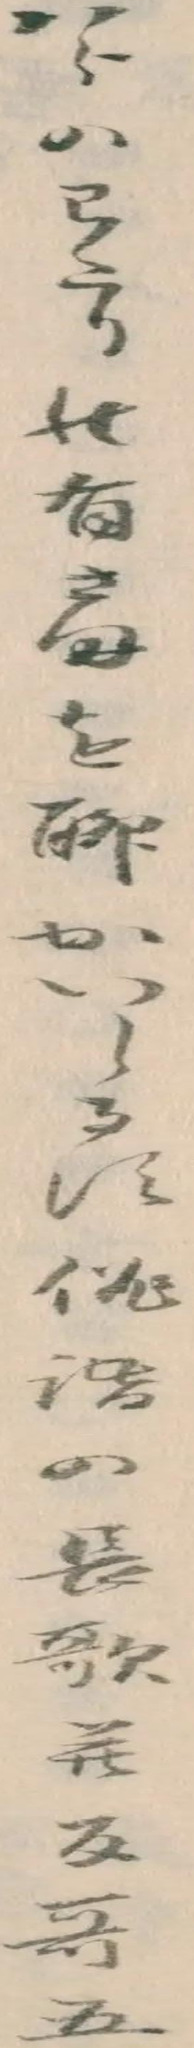はらのわたりの有さまを聊かいしるす俳諧の長歌并反哥五
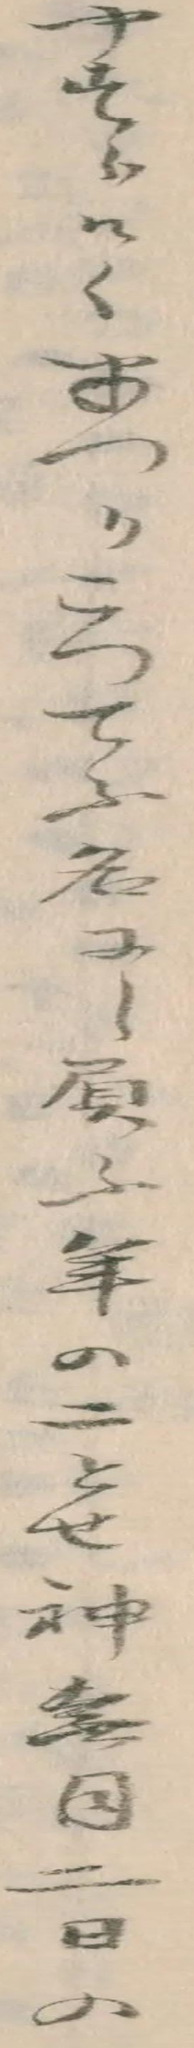やすらけくまつりこつてふ名にし負う年の二とせ神無月二日の
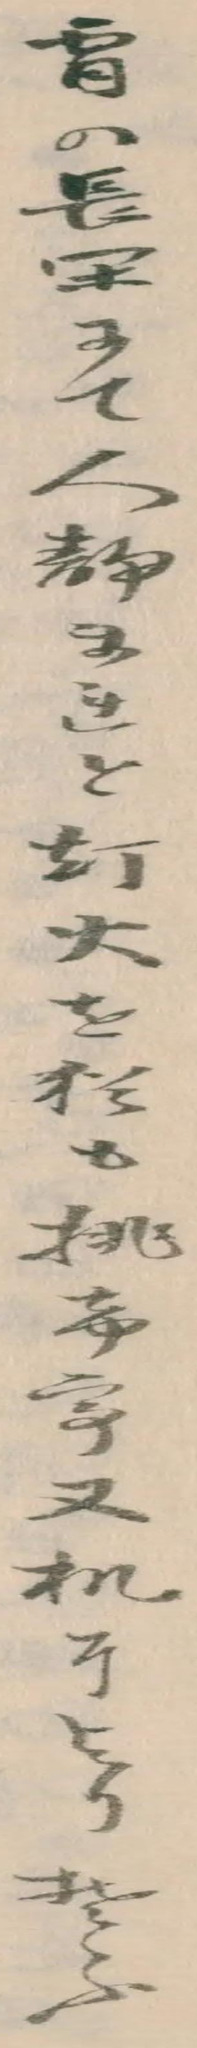宵の長閑にて人静まれと灯火を猶も排けて又机によりそふ
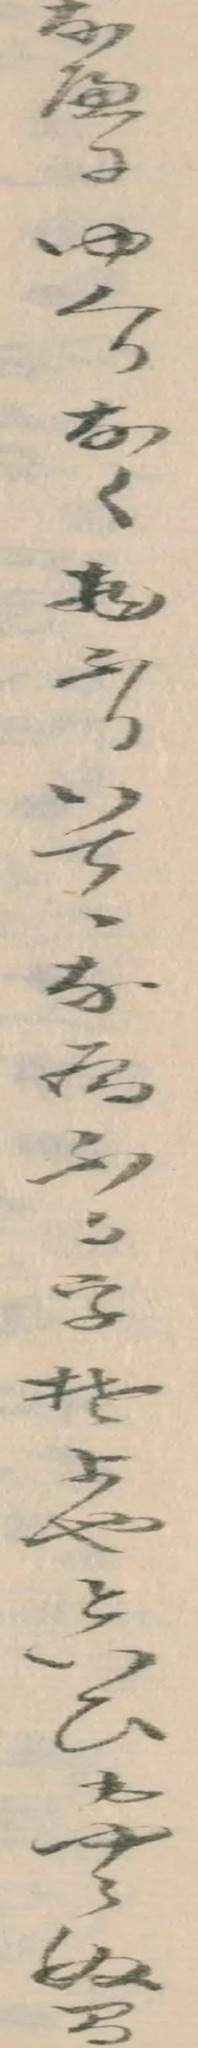なへにゆくりなく物ふりいてゝなゐふるをそよやといひもやらぬ間
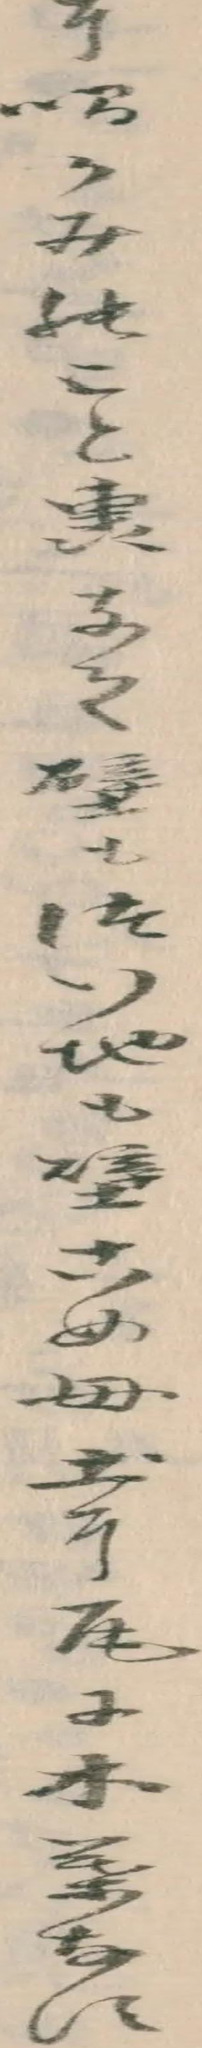に鳴かみのこと轟なて壁もつい地も壁こめも土に瓦に木葉なす
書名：地災撮要. 巻10(地震之部) 上,下
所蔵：国立国会図書館 National Diet Library, JAPAN
